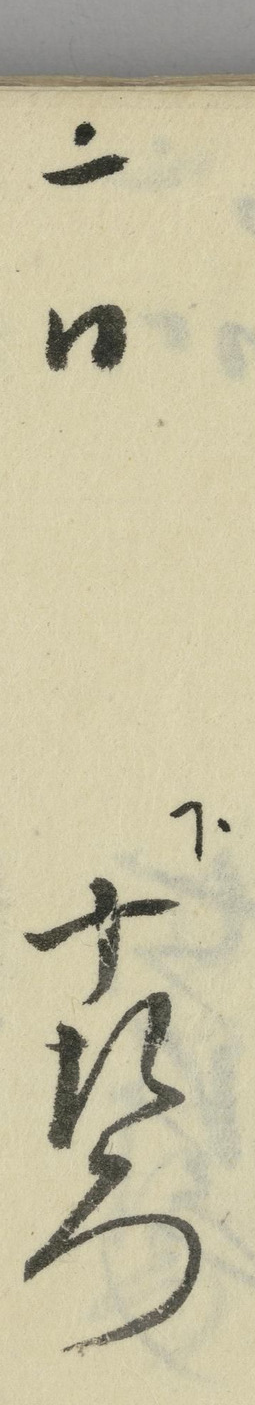一同吉左衛門
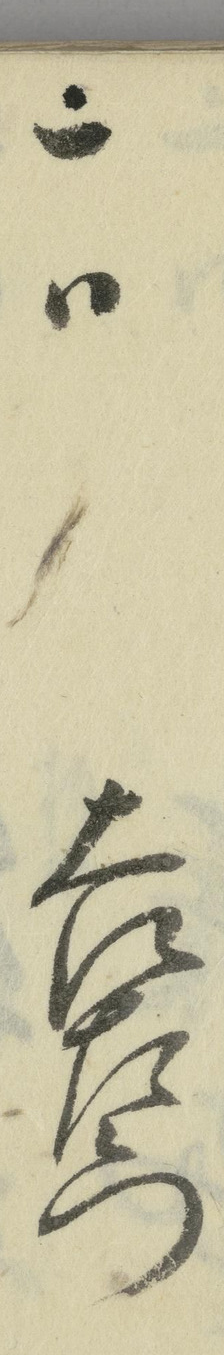一同吉左衛門
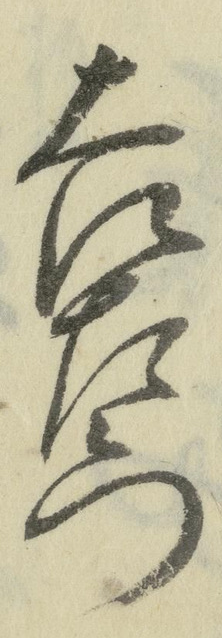十左衛門
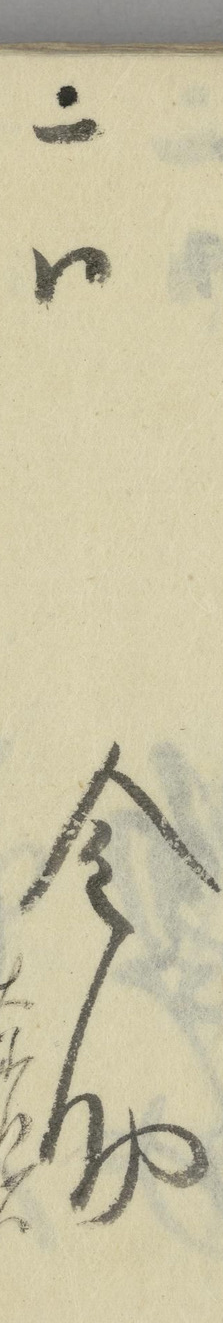一同金助
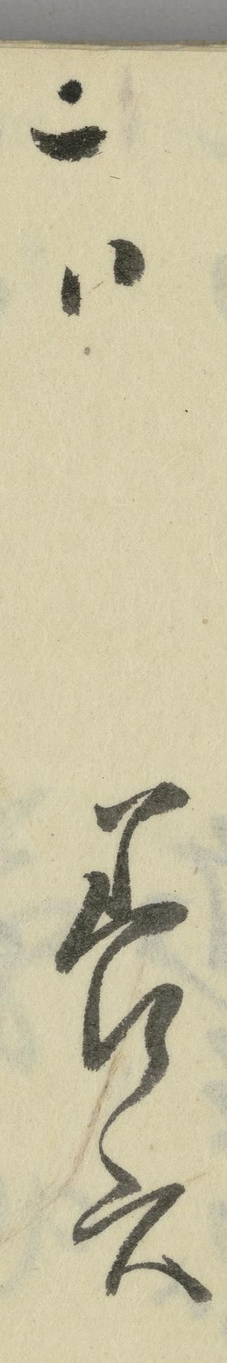一同平吉
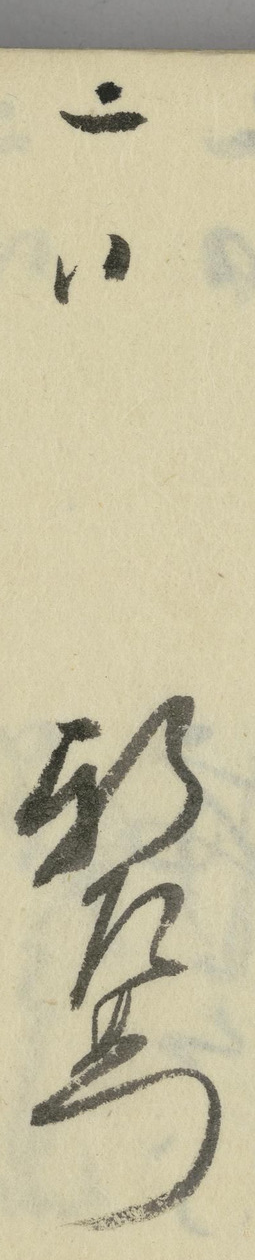一同新左衛門
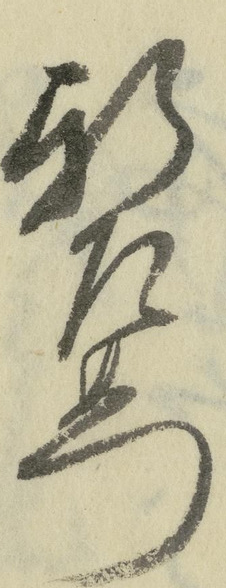十左衛門
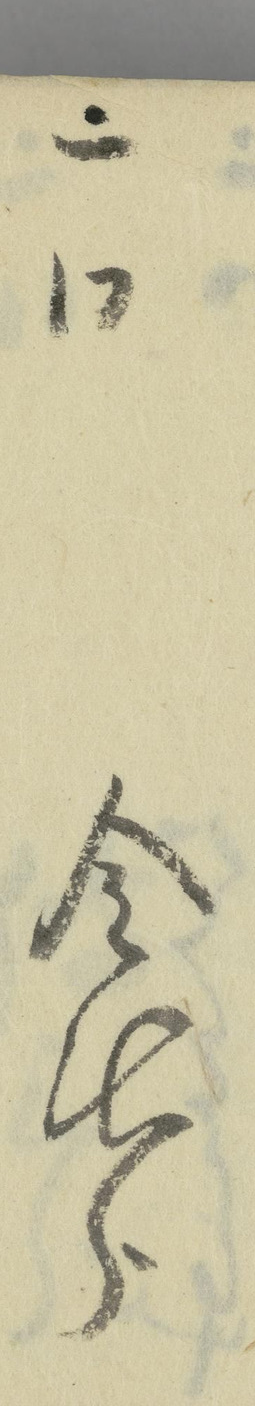一同金次郎
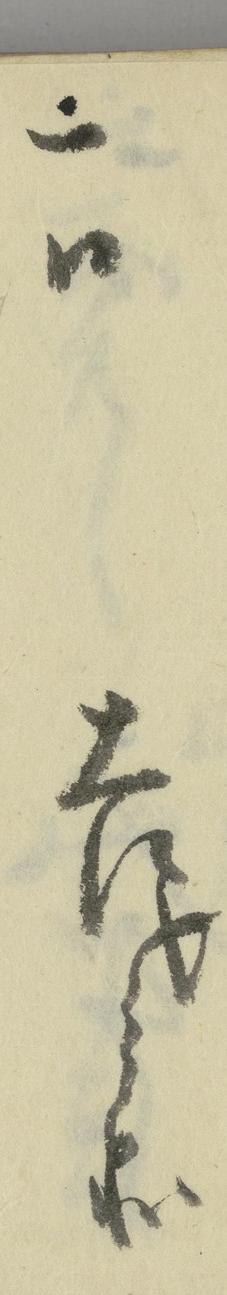一同吉左衛門
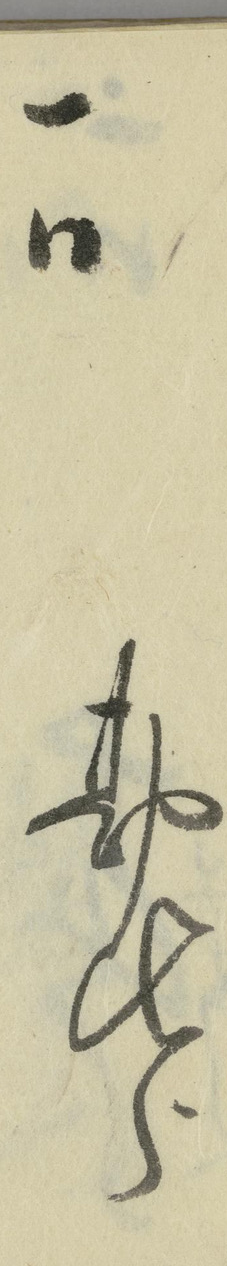一同金次郎

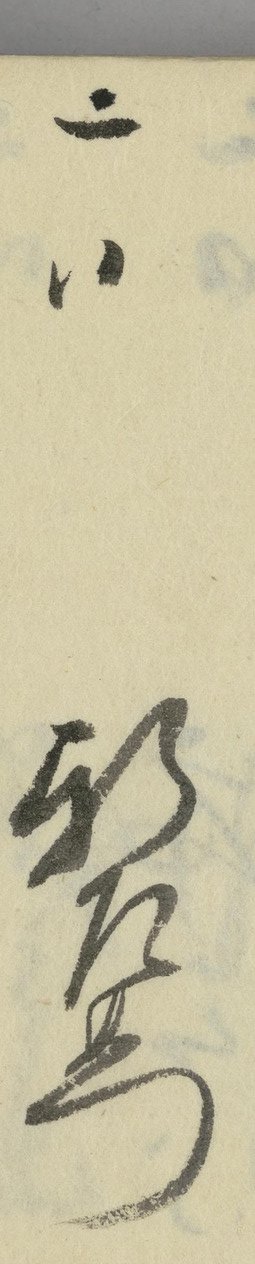一同吉右衛門
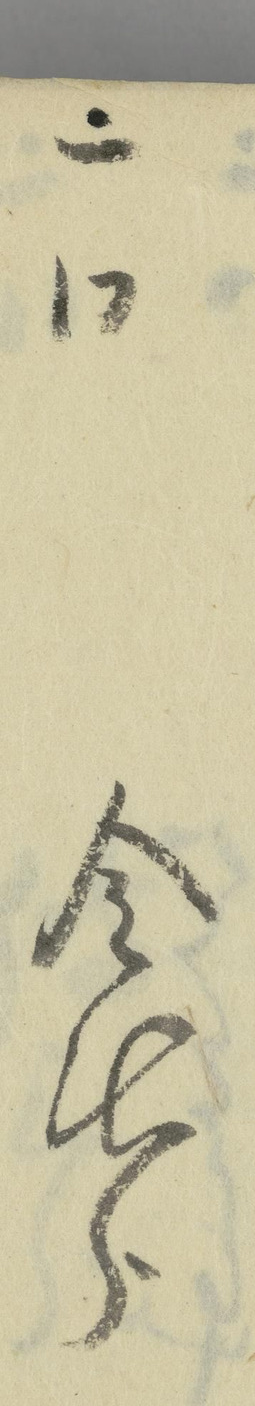一同勘次郎
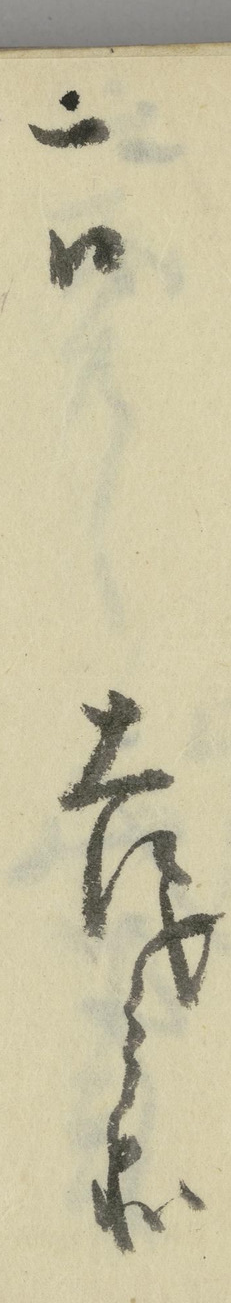一同吉右衛門
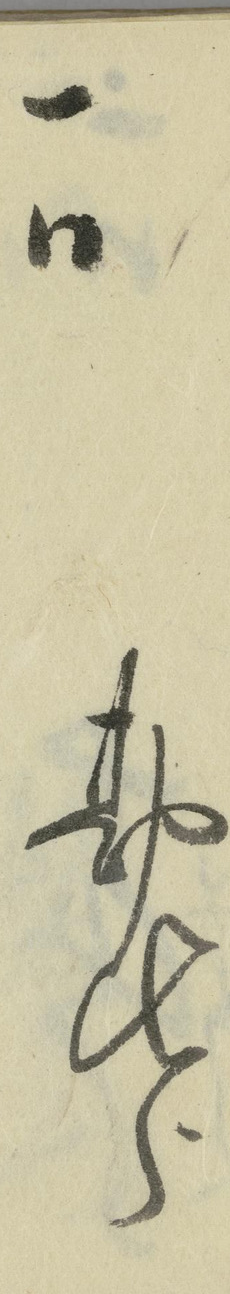一同勘次郎
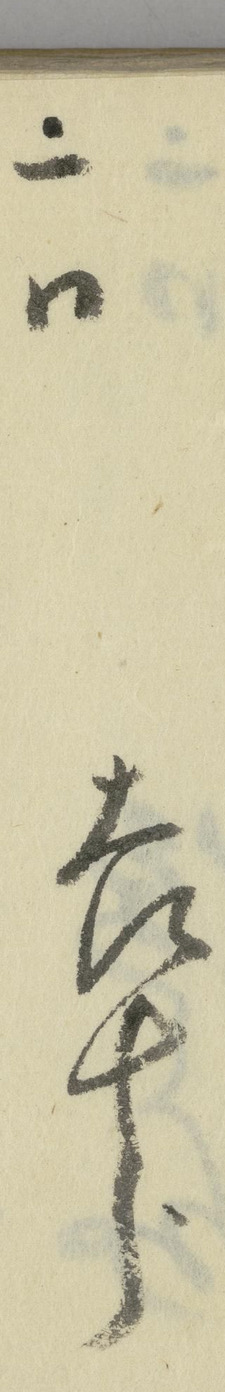一同吉右衛門
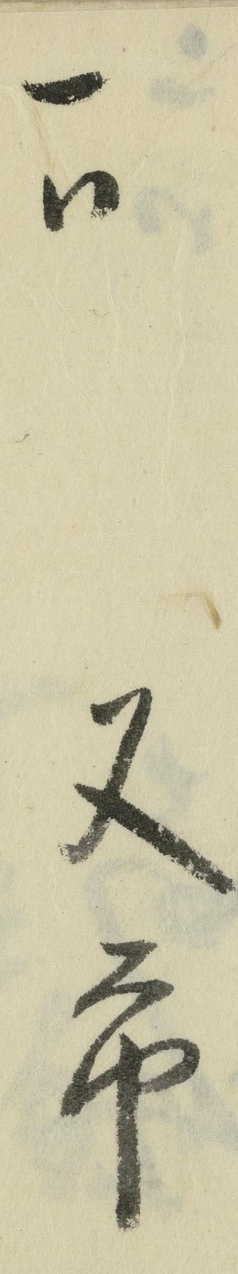一同又市
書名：天明淺間噴火ニ関スル書類
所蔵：東京大学地震研究所図書室 Earthquake Research Institute Library, The University of Tokyo, JAPAN
